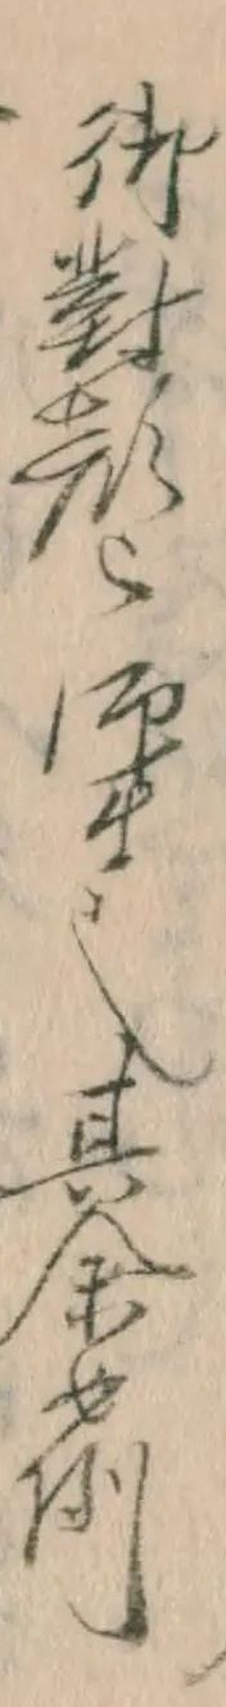御對顔被仰付也其余如例
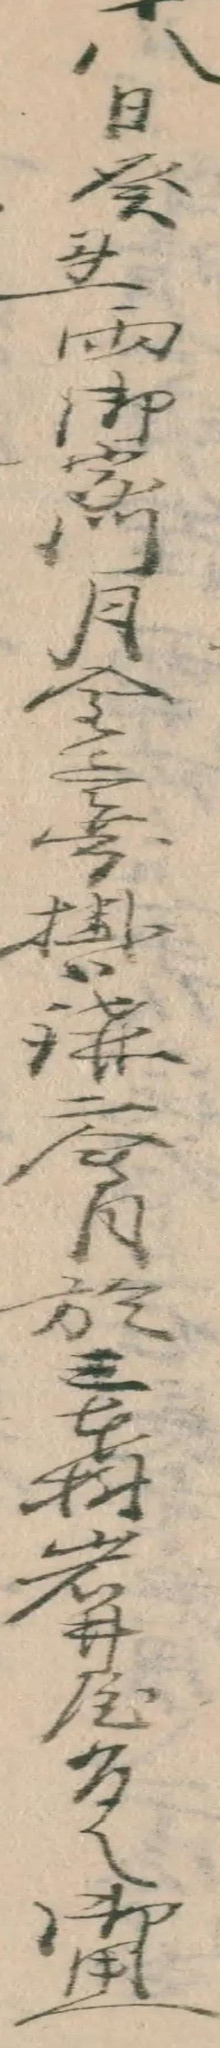十八日癸丑雨御家門月會壱掛御講二合目於三本村岩井屋有之御用人
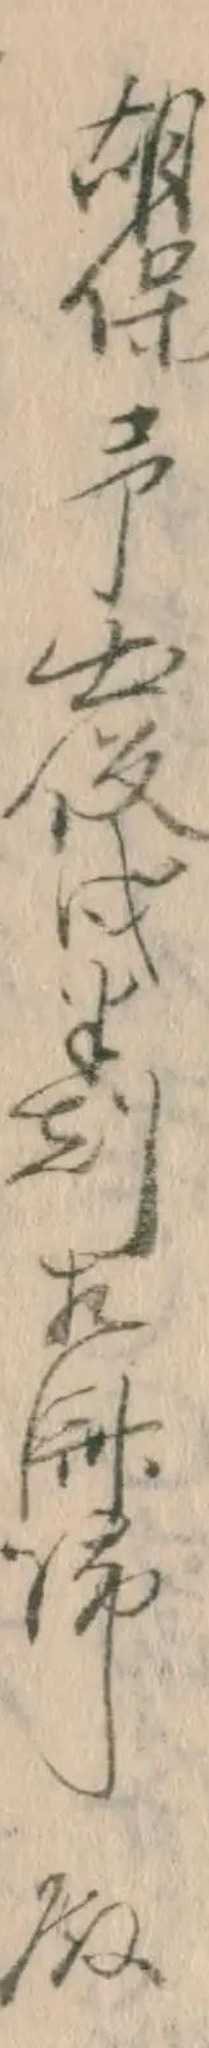胡保予出役戌半刻相済帰ル
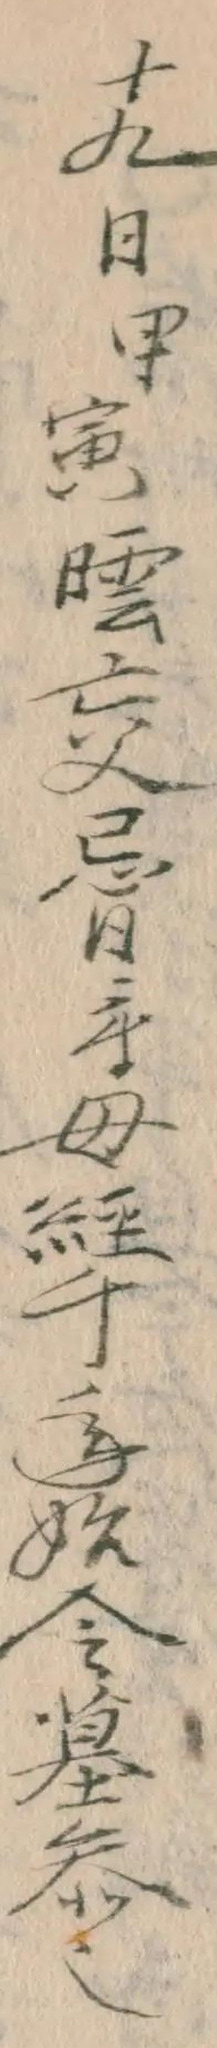十九日甲寅曇亡父忌日ニ付母経千年始令墓参也
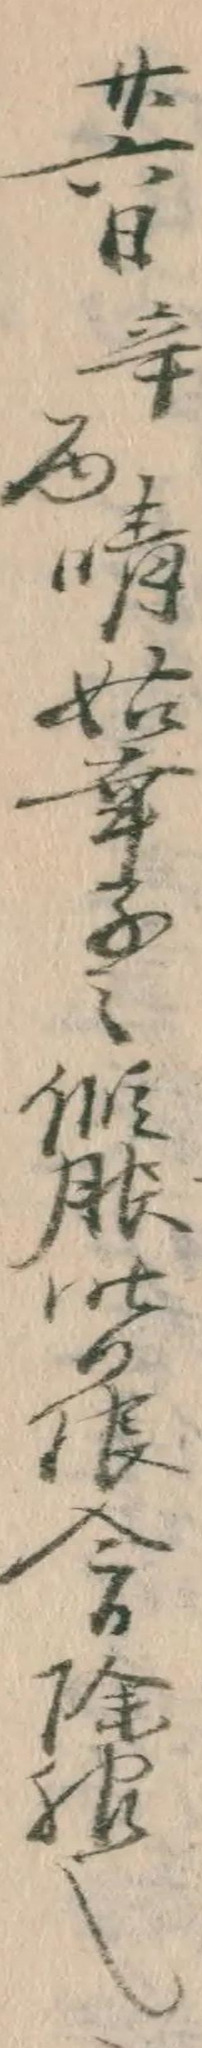廿六日辛酉晴始幸子之仮服昨日限今日除服之
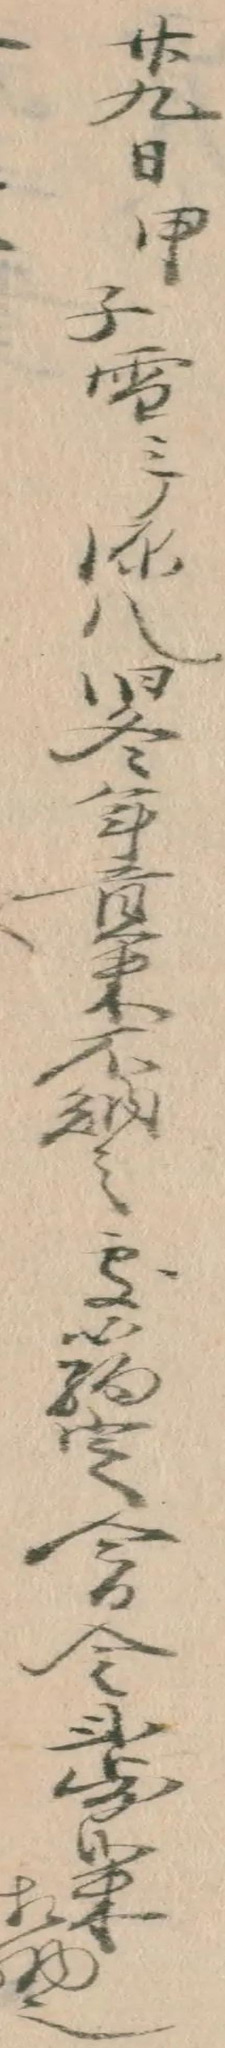廿九日甲子雪ニテ源八旧冬年貢米不納之處御約定今日金弐歩弐朱相成也
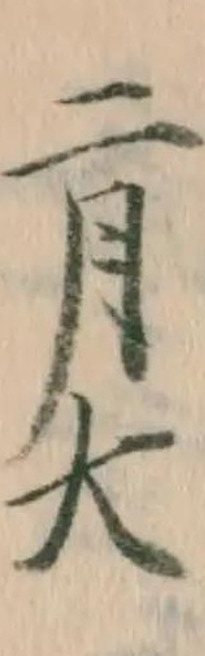二月大
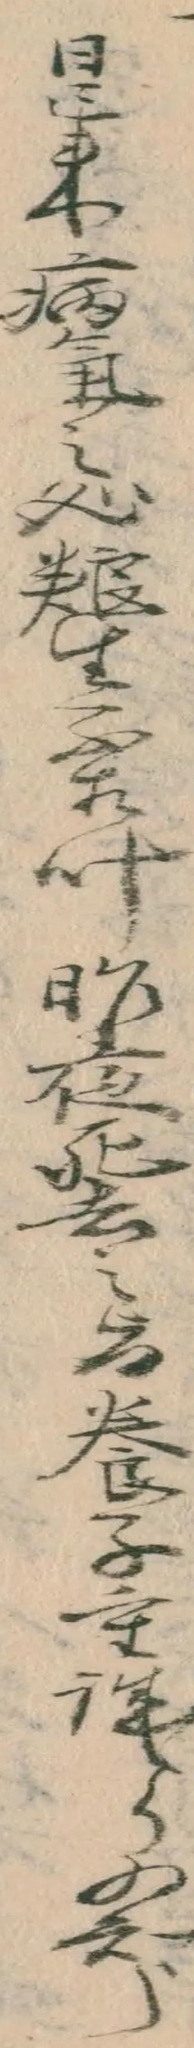日已来病気之処養生不相叶昨夜死去之旨養子重誠より為知申
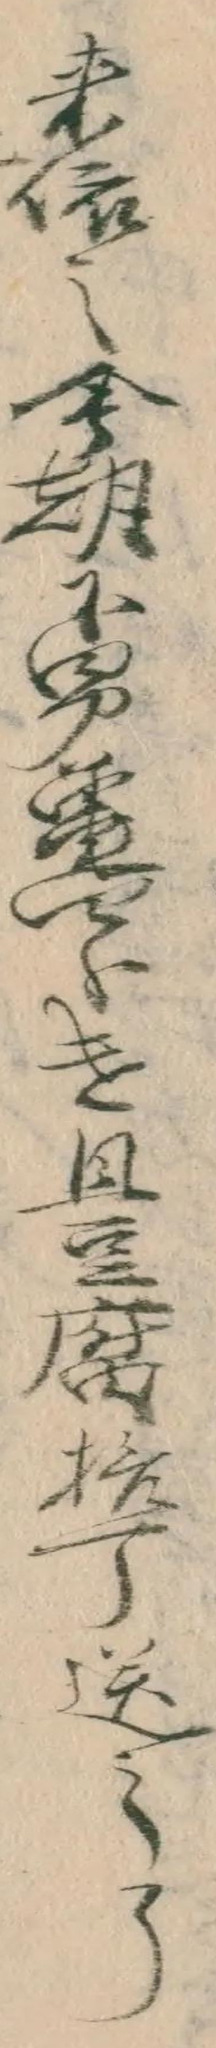来依之今朝下男亀四郎遣且豆腐拾丁送之了
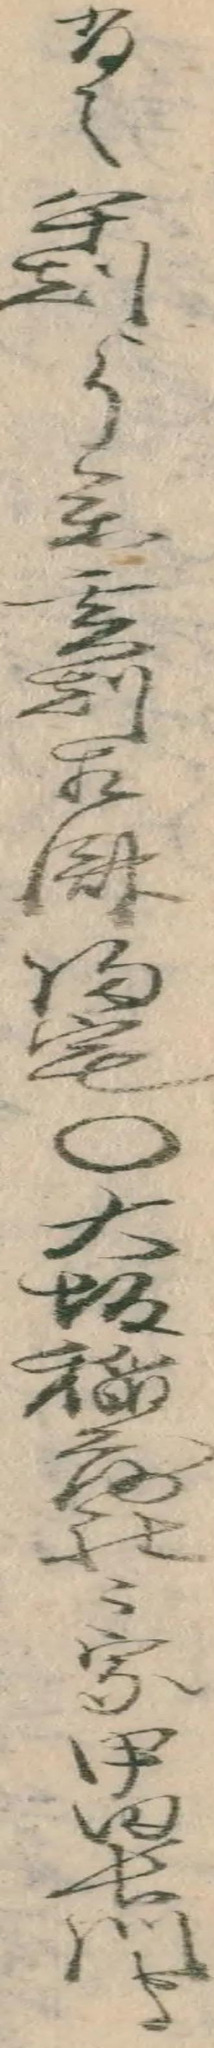有之午刻より参亥刻相済帰宅〇大坂稲荷社之家甲田長門守
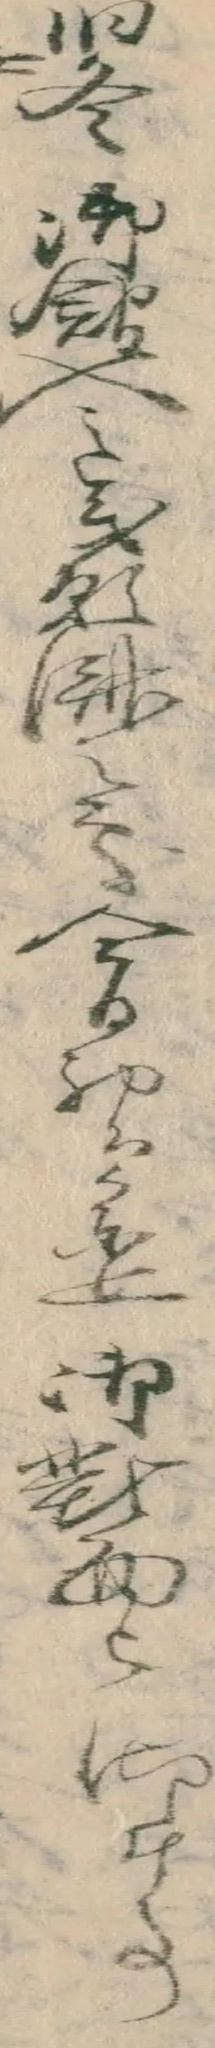旧冬御館入之義願済之處今日初而被東上御對面被仰付候事
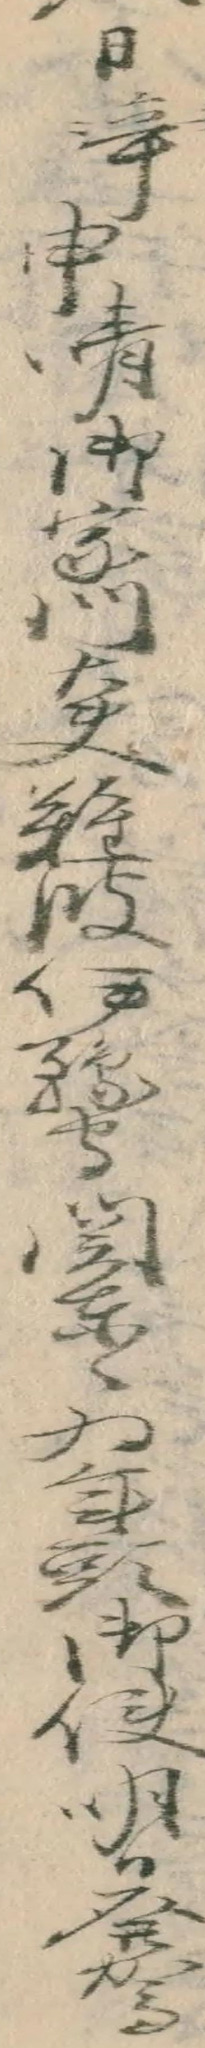八日壬申晴御家門大夫難波伊豫守関東へ為年頭御使明日発駕
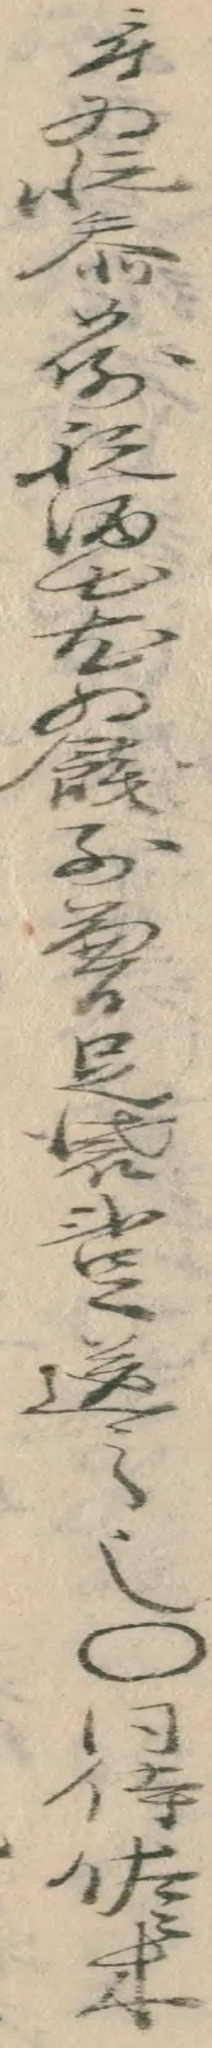ニ付為祝参如例祝酒出尤為餞別兼日足袋弐足送之也○同侍佐々木
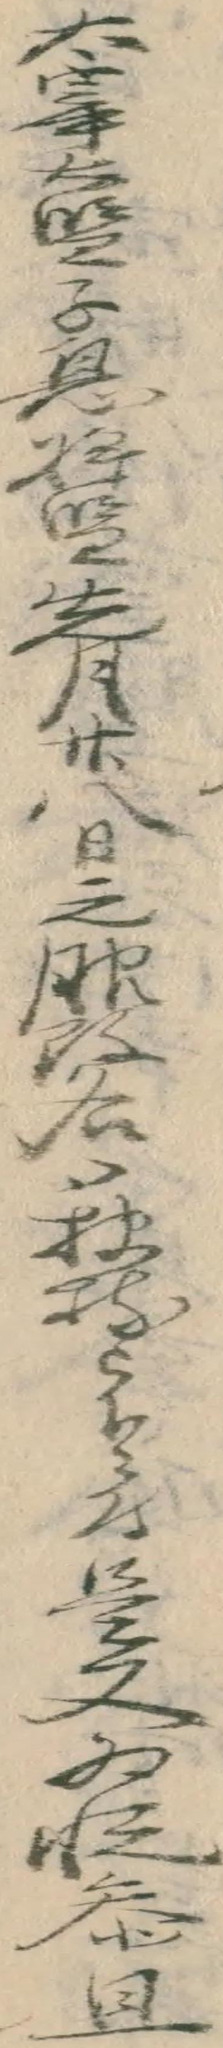太宰大監子息将監先月廿八日元服改各御扶持被下ニ付是又為祝参且
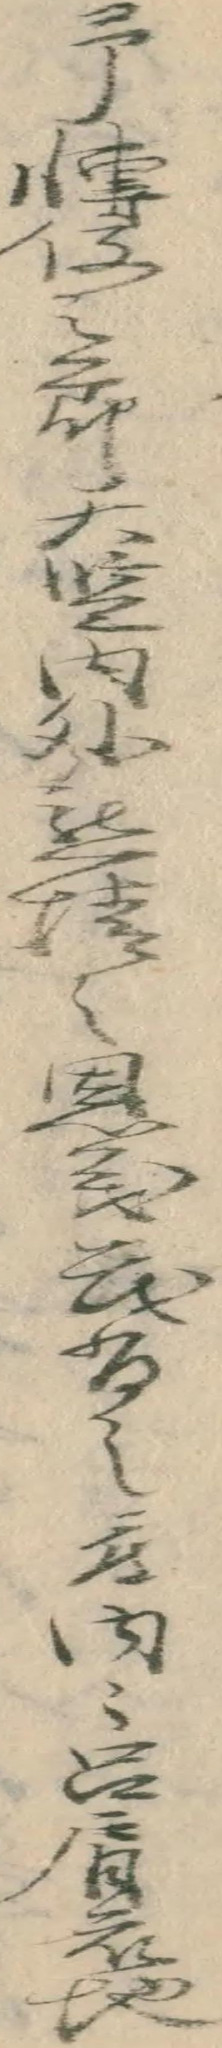予轉役之節大監内外罷清之恩義も有之ニ付内々呂肩衣地
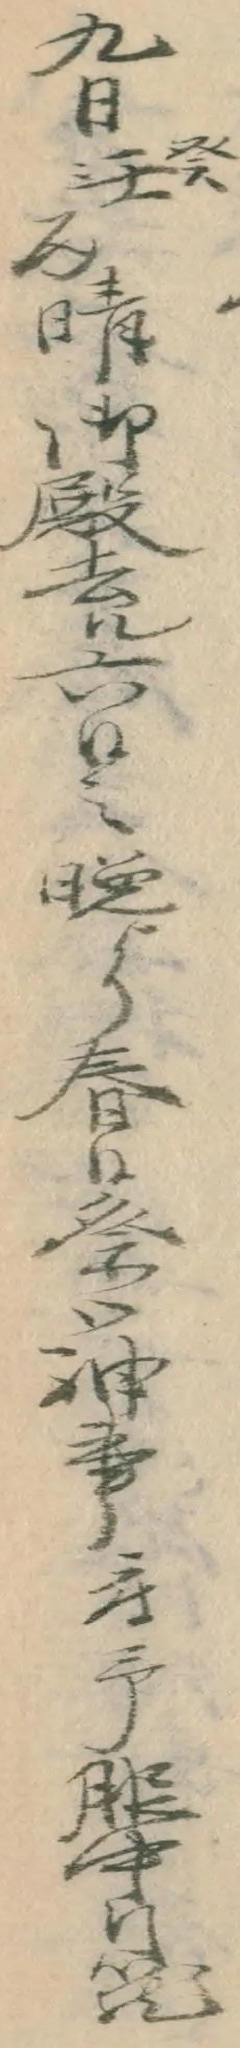九日癸酉晴御殿去ル六日之晩より春日祭御神事ニ付予服中引籠
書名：賀茂社記録. 第65冊
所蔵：国立国会図書館 National Diet Library, JAPAN
